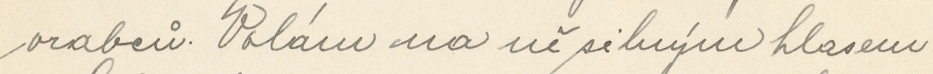vrabců. Volám na ně silným hlasem:
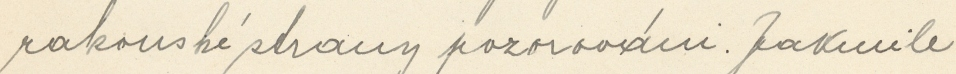rakouské strany pozorováni. Jakmile
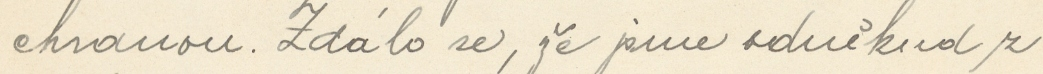chranou. Zdálo se, že jsme odněkud z
